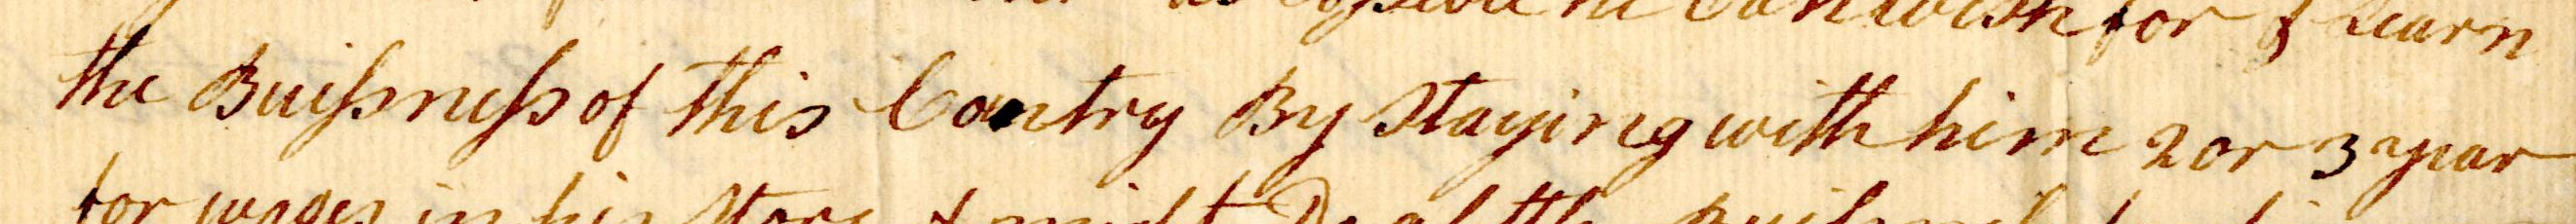the Buisiness of this Country By staying with him 2 or 3 year
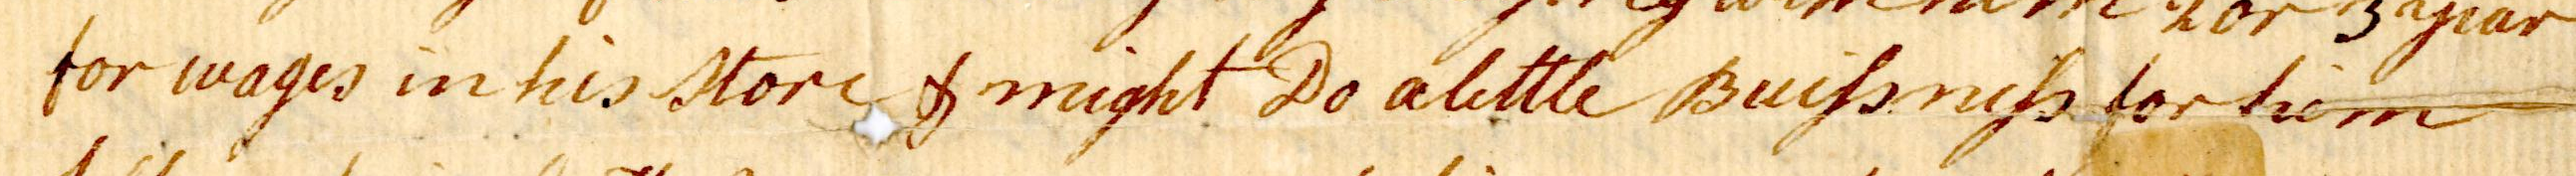for wages in his store & might Do a little Buisiness for him
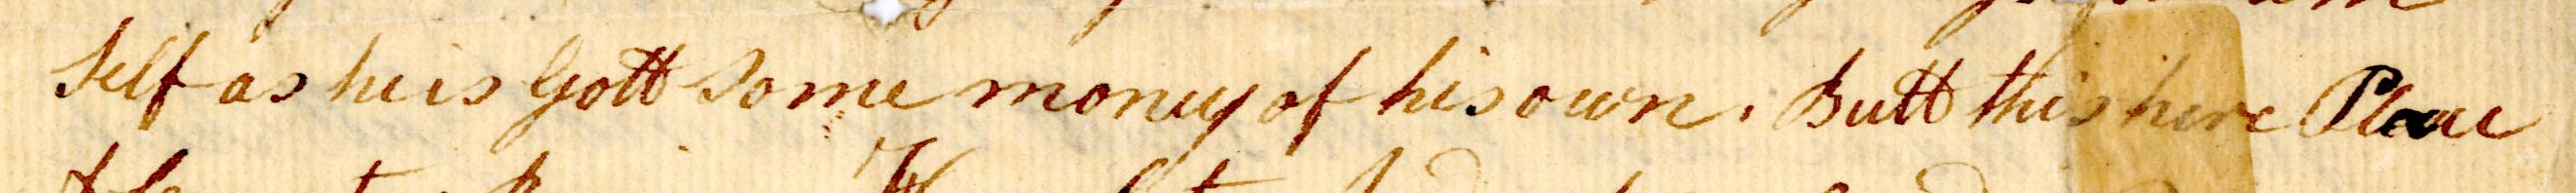Self as he is Gott some money of his own. Butt this here Place
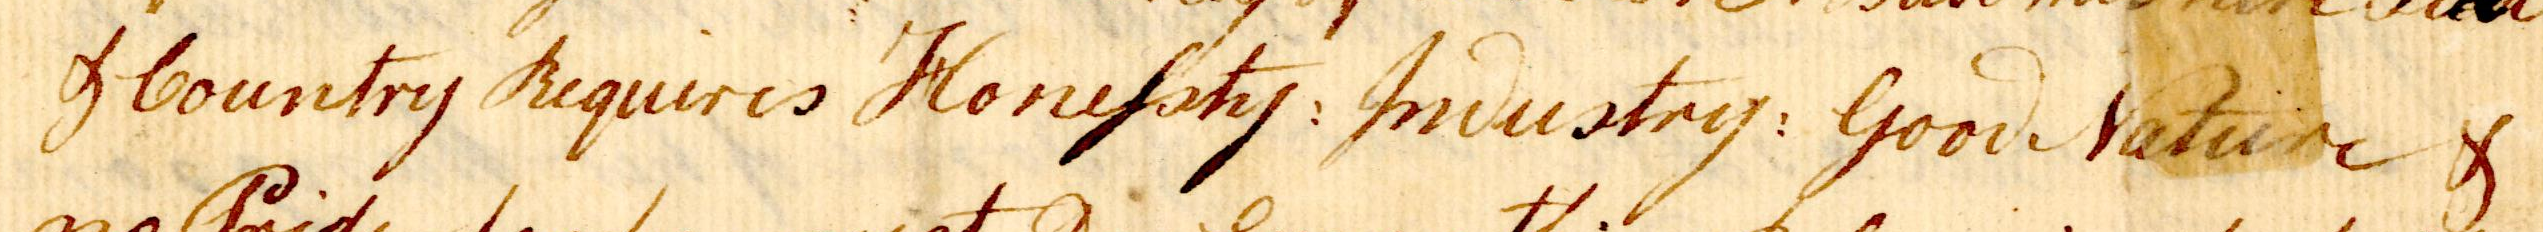& Country Requires Honesty: Industry: Good Nature &
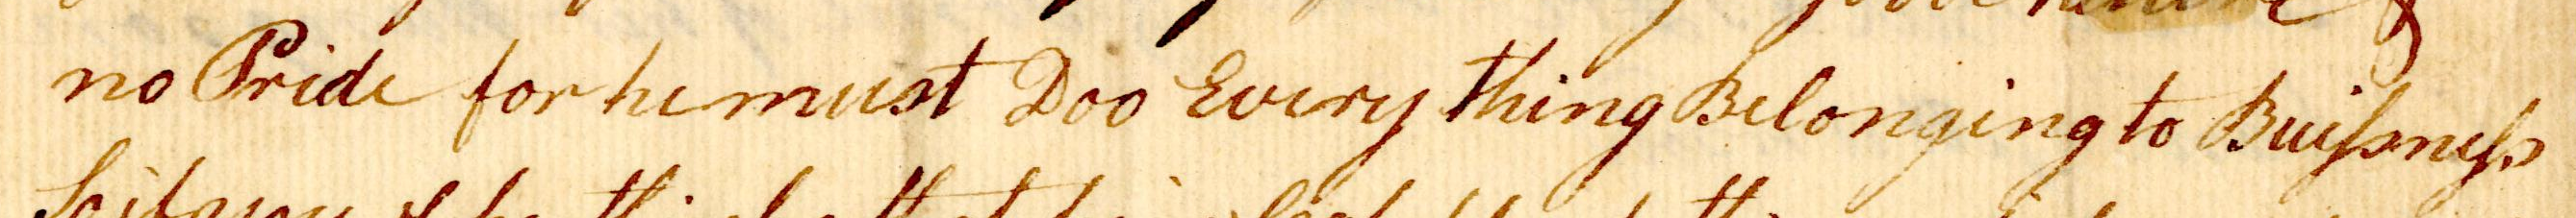no Pride for he must Doo every thing Belonging to Buisness
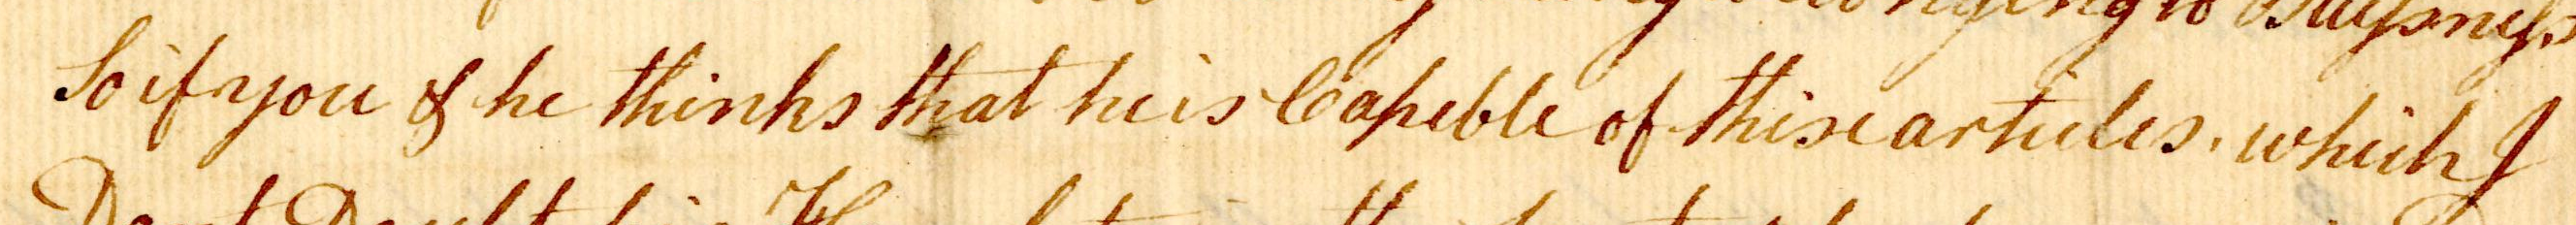So if you & he thinks that he is Capible of these articles which I
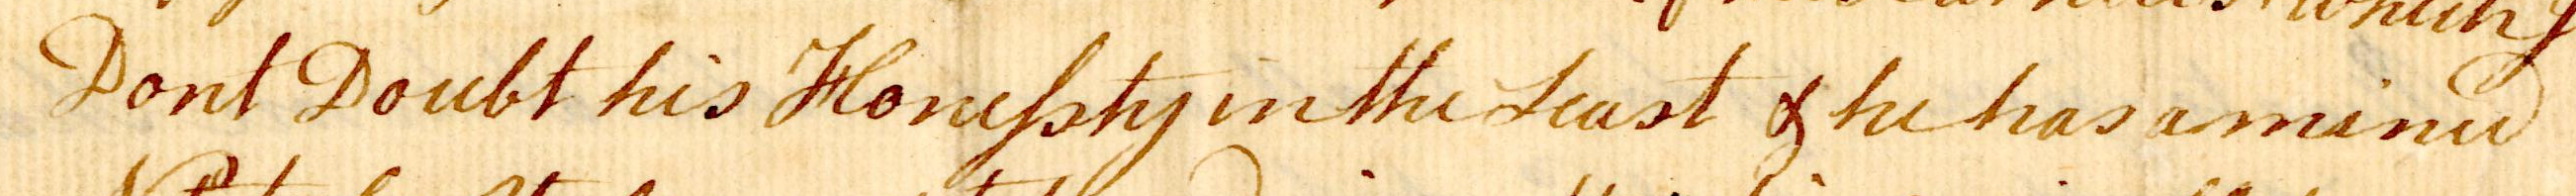Dont Doubt his Honessty in the Least & he has a mind
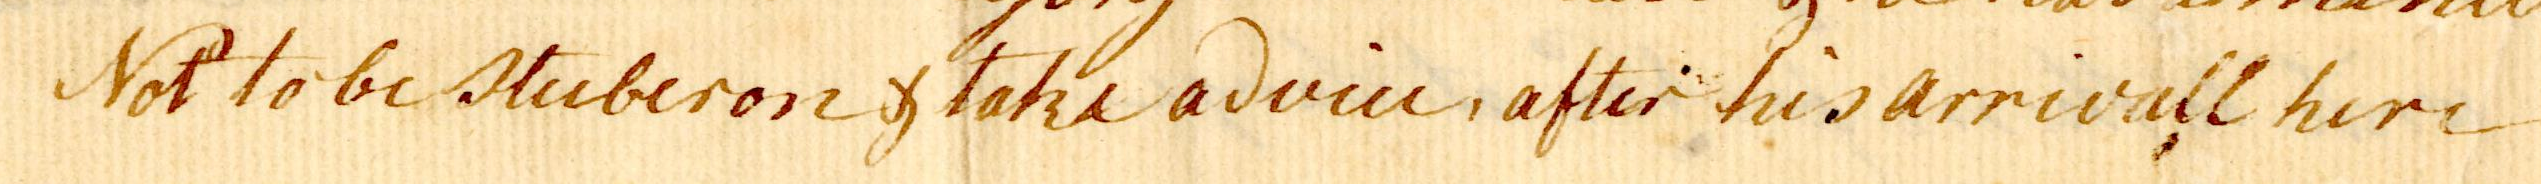Not to be stuberon & take advice, after his arrivall here
